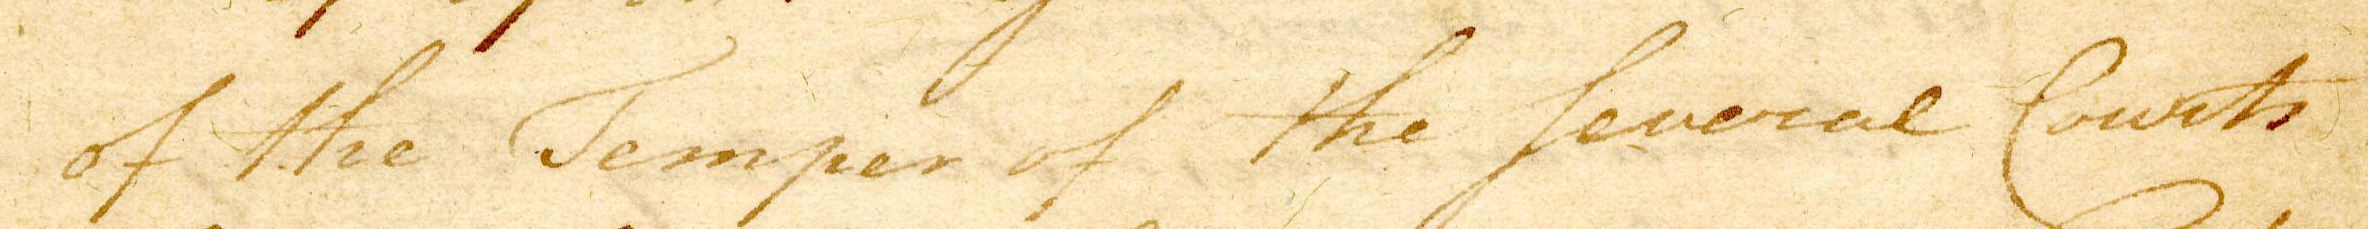of the Temper of the several Courts
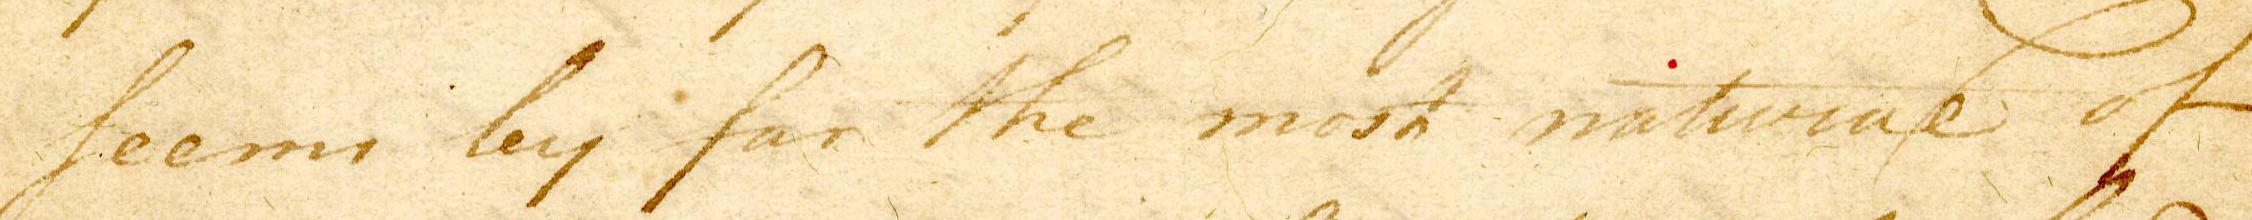seems by far the most natural of
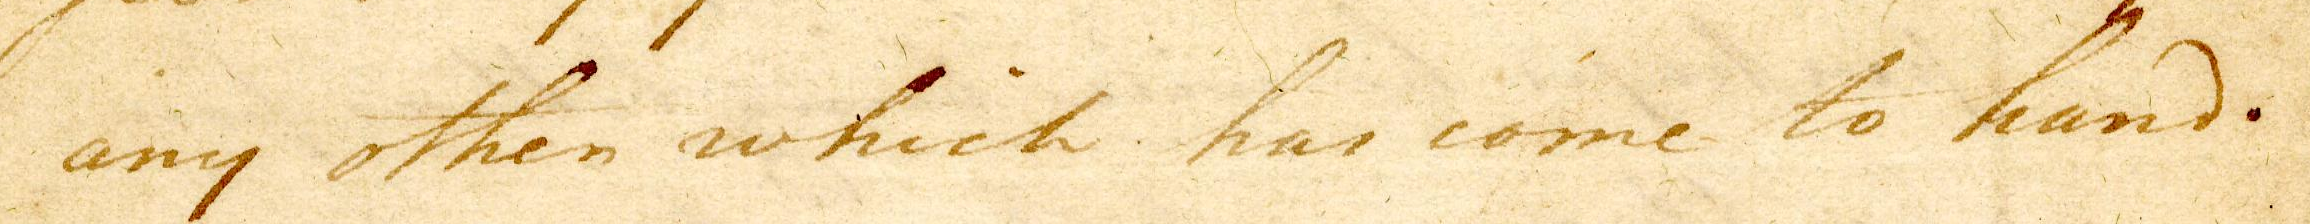any other which has come to hand
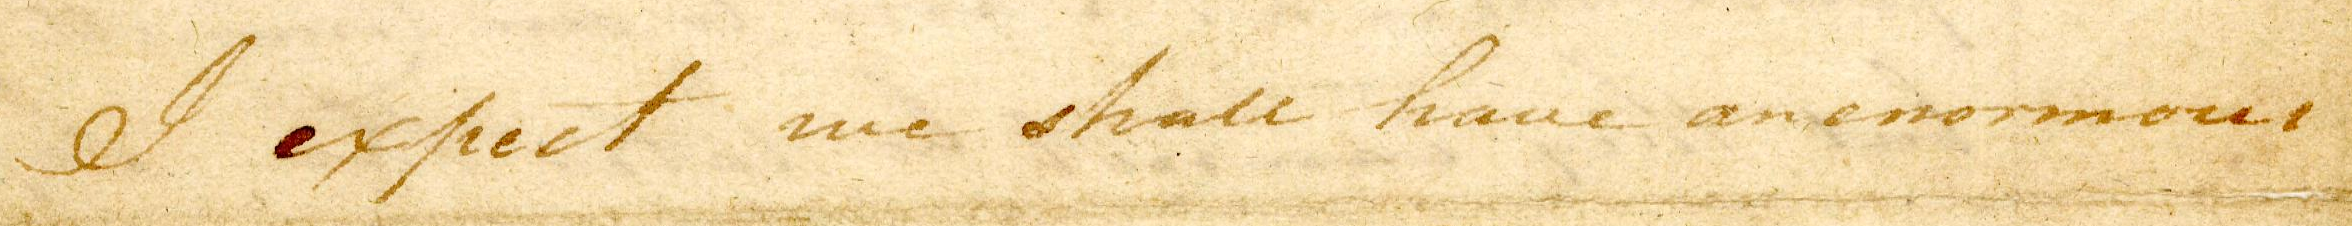I expect we shall have an enormous
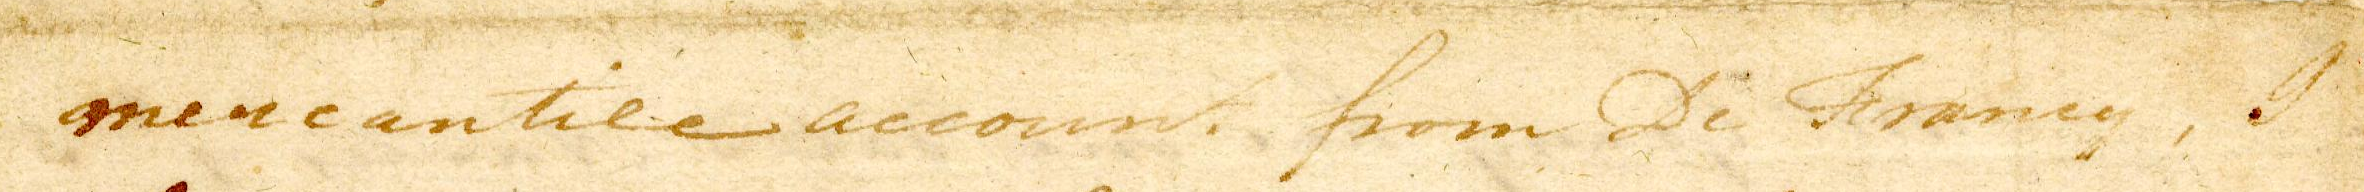mercantile account from De Franey, I
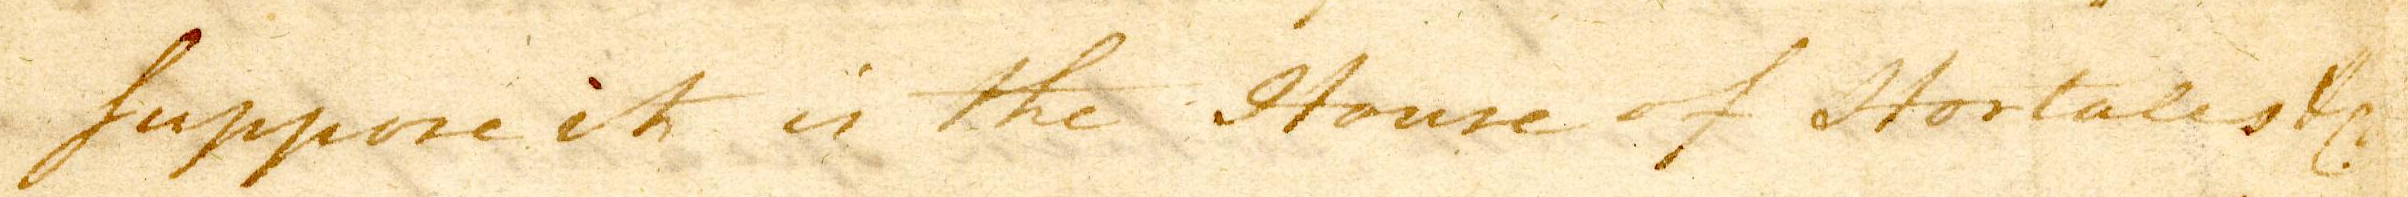suppose it is the House of Hortales &C
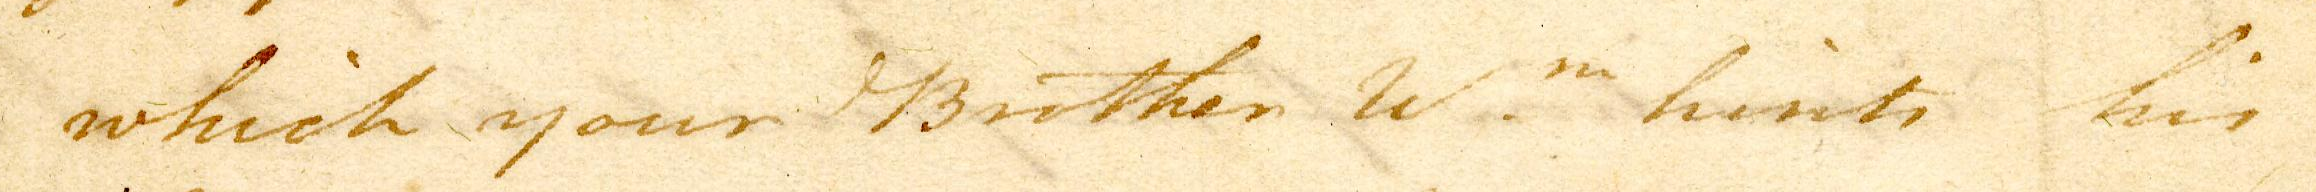which your Brother W^m. hints his
